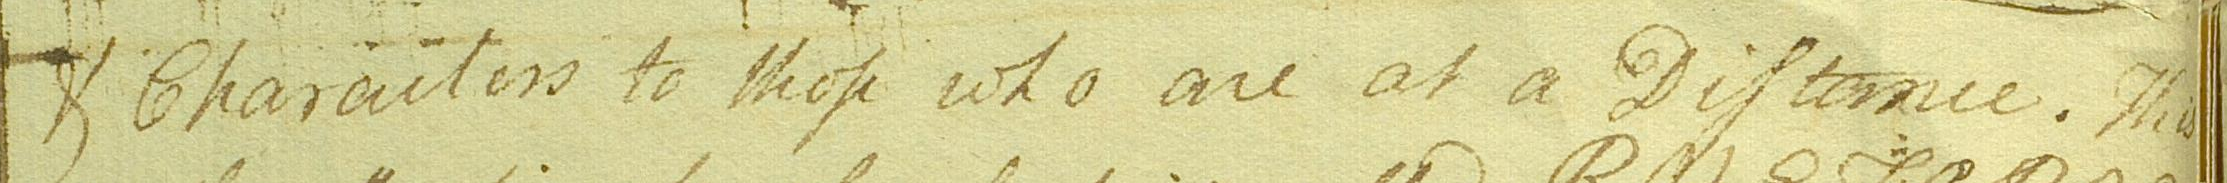& Characters to those who are at a Distance. This
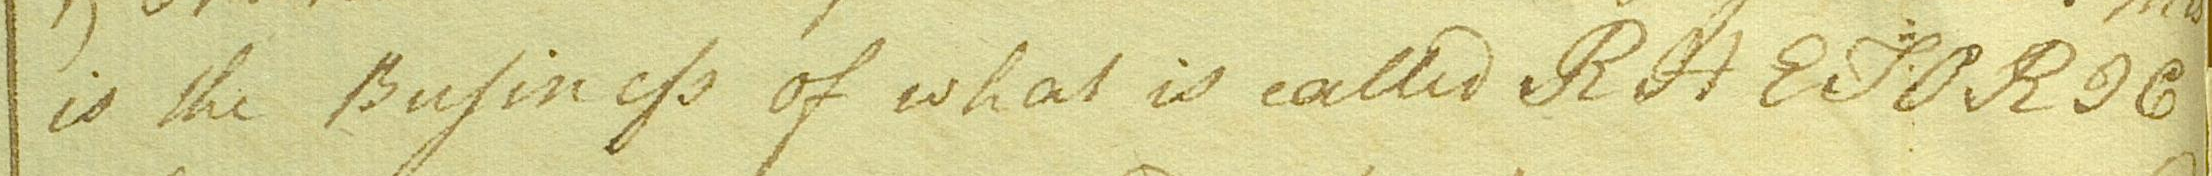is the Business of what is called RHETORIC
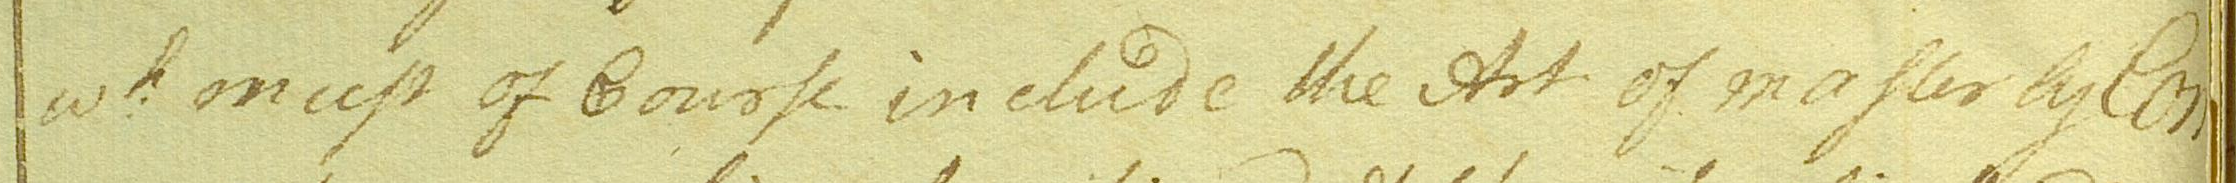w^h must of Course include the Art of masterly Com
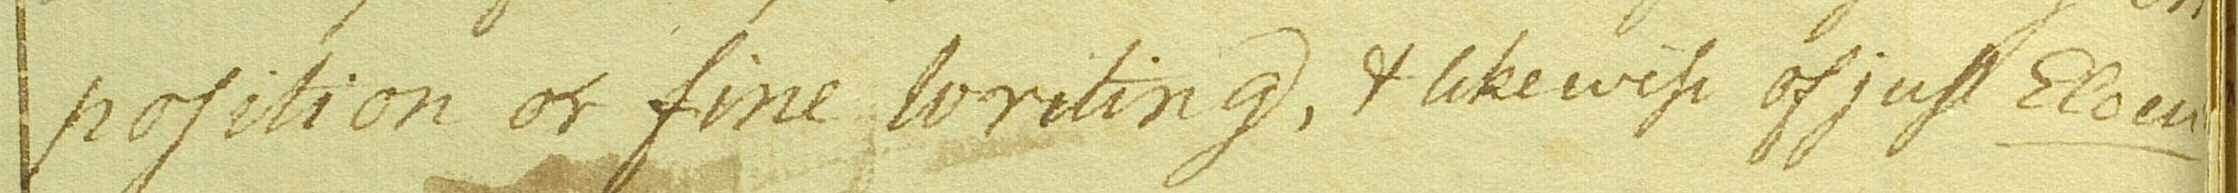position or fine writing, & likewise of just Elocu
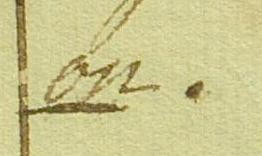on.
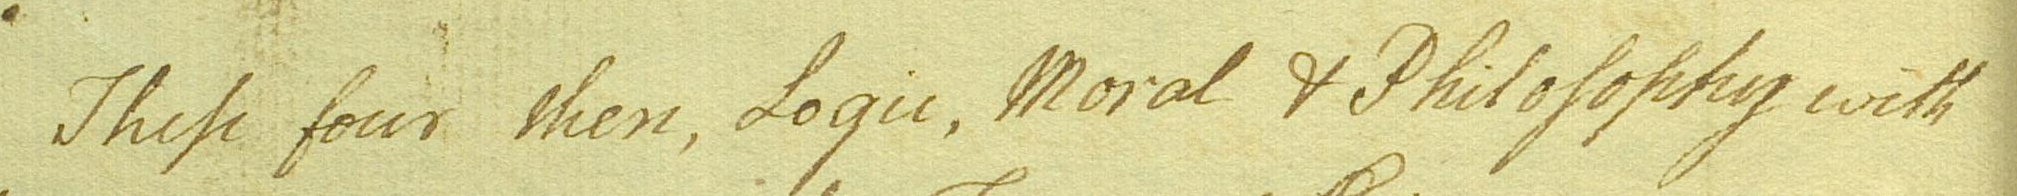These four then, Logic, Moral & Philosophy with
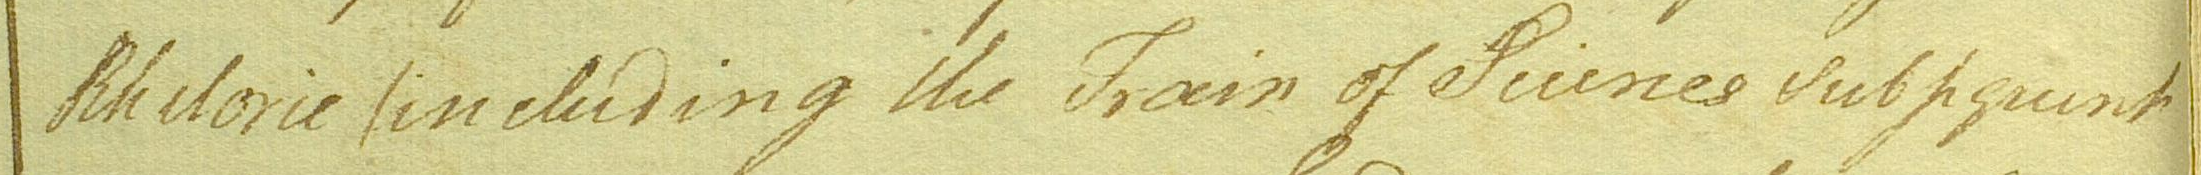Rhetoric (including the Train of Scienes subsequent
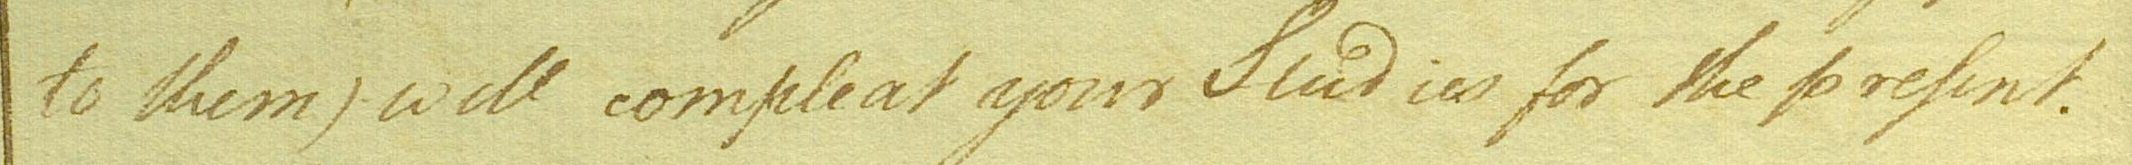to them) will compleat your Studies for the present.
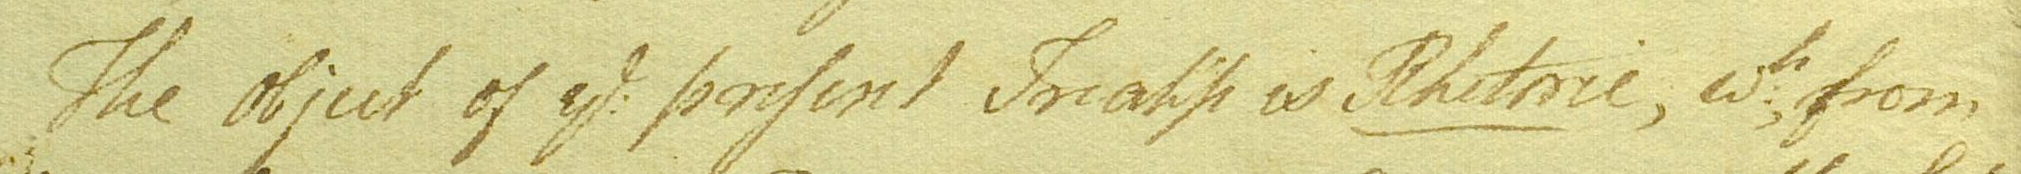The object of y^e: present Treatise is Rhetoric, w^h., from
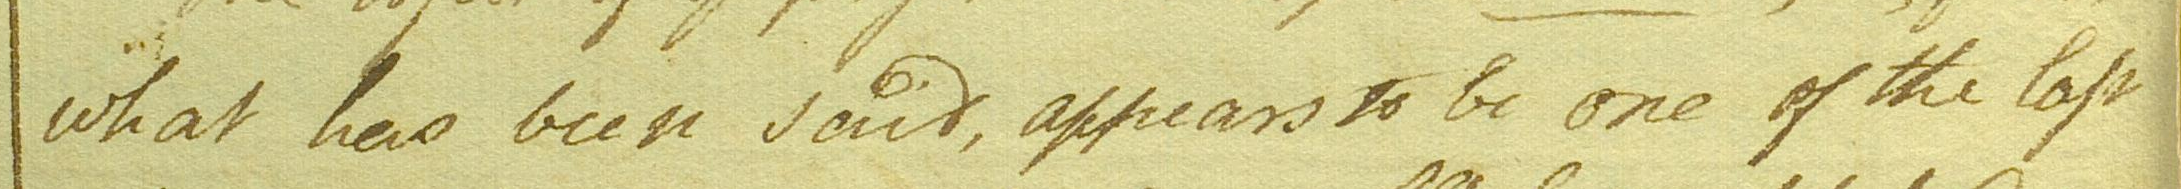what has been said, appears to be one of the last
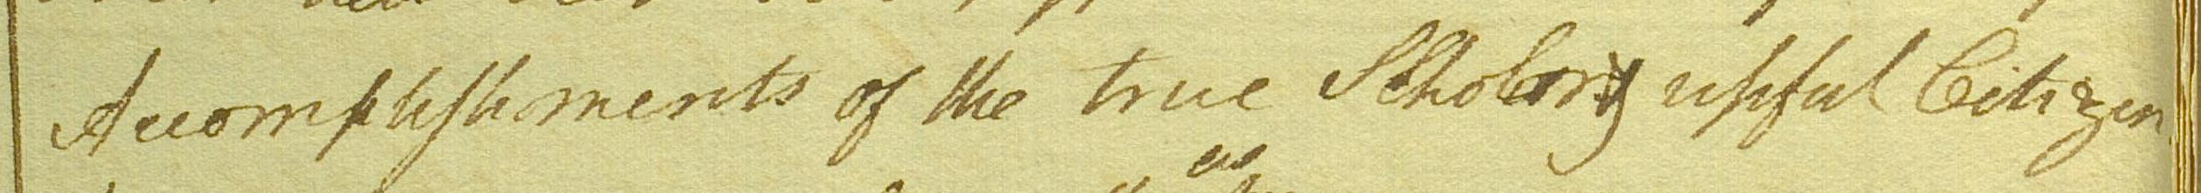Accomplishments of the true Scholarly useful Citizen.
